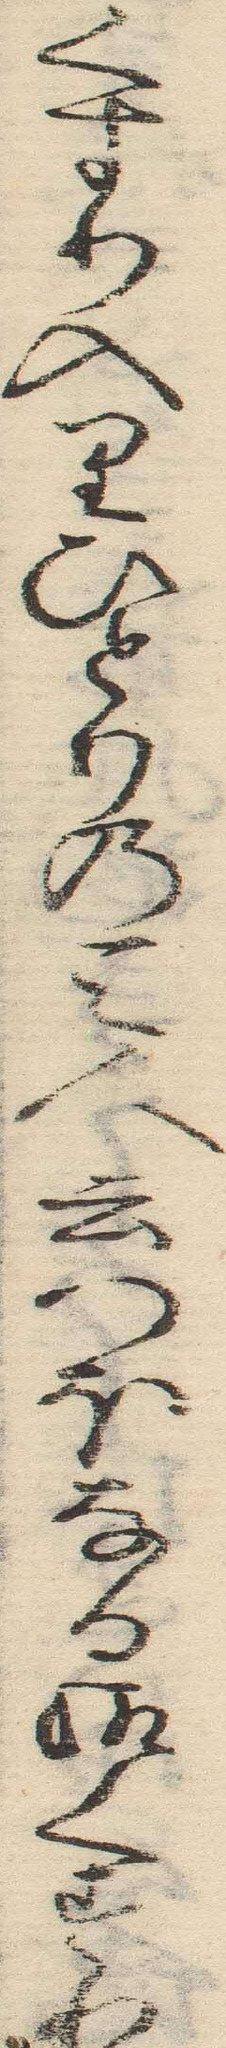くすり入りひとりの天人云つほなる御くすり

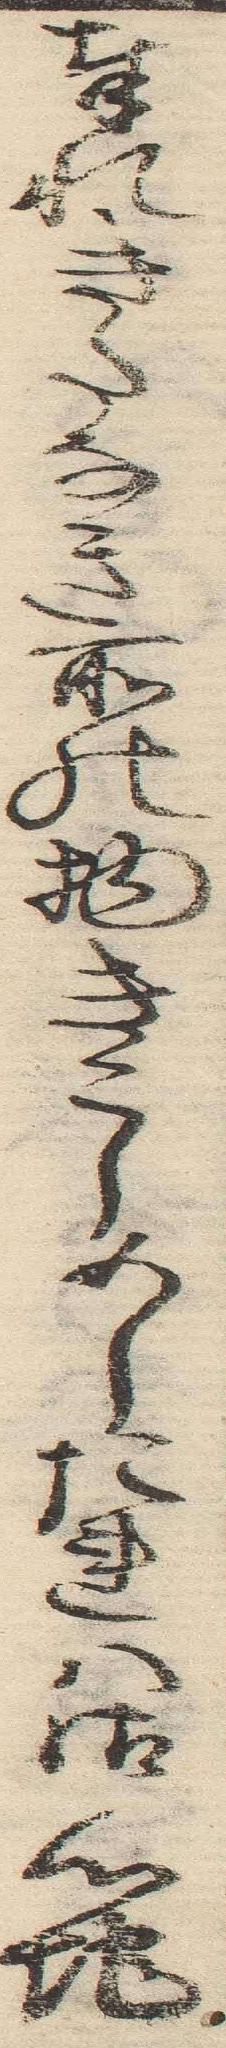奉れきたなき所の物きこしめしたれは御心地
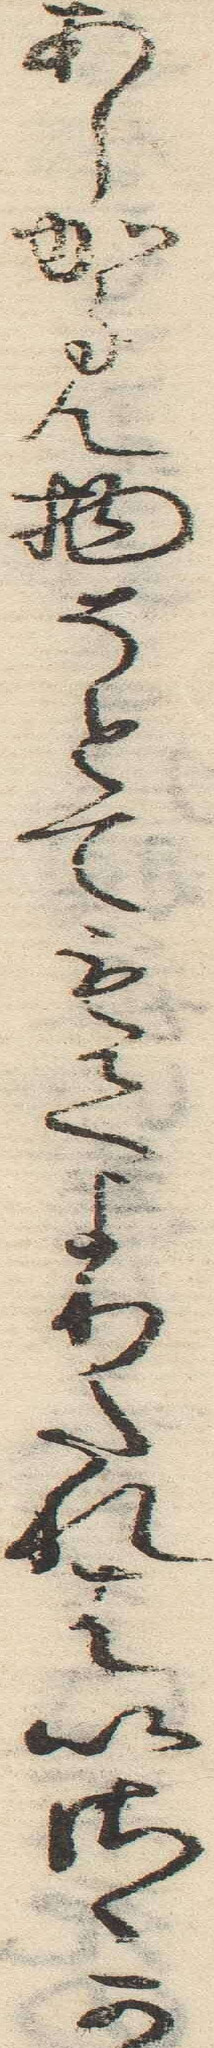あしからん物そとてもてよりたれはいさゝか
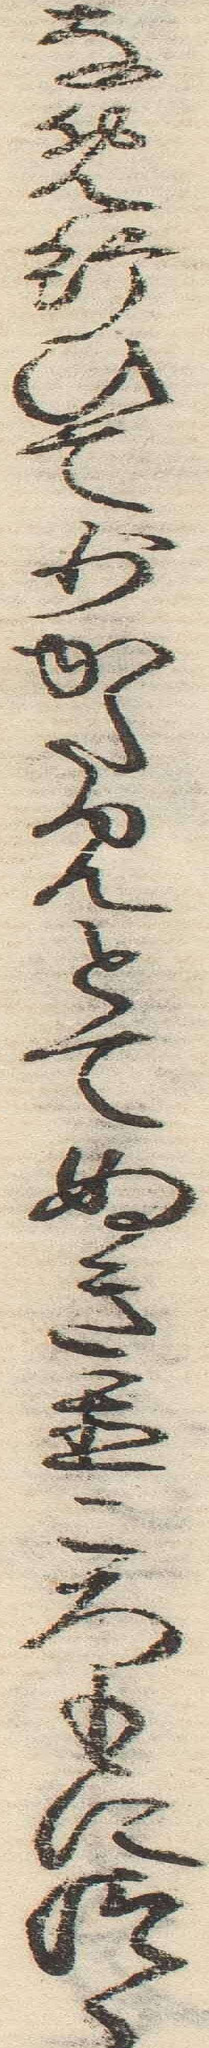なめ給ひて少かたみとてぬき置ころもにつゝ
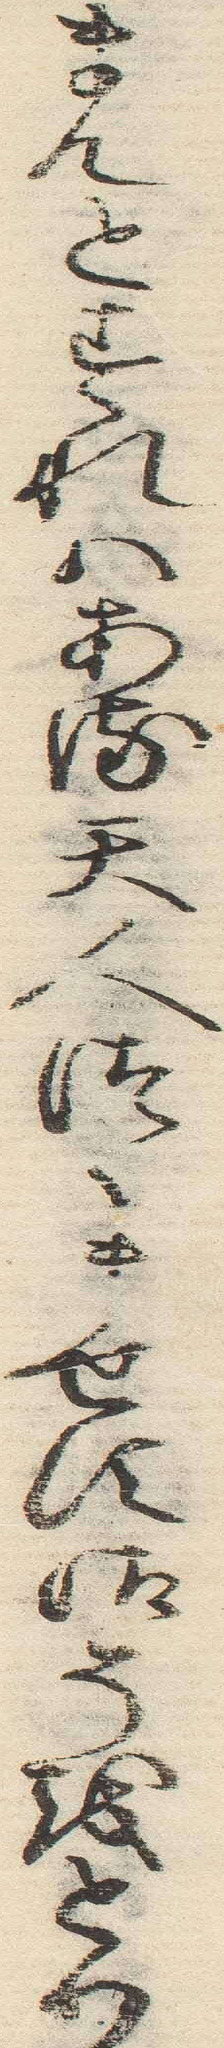まんとすれはある天人つゝませす御そをとり
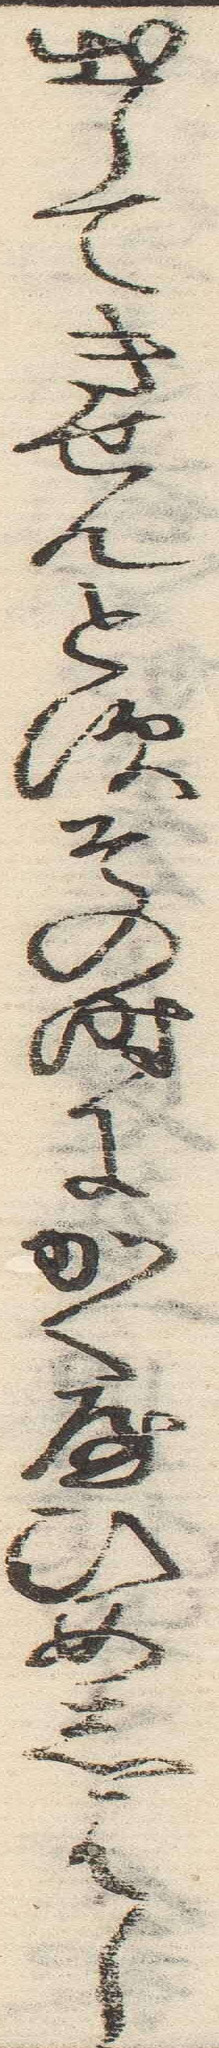出してきせんとすその時にかくやひめしはし
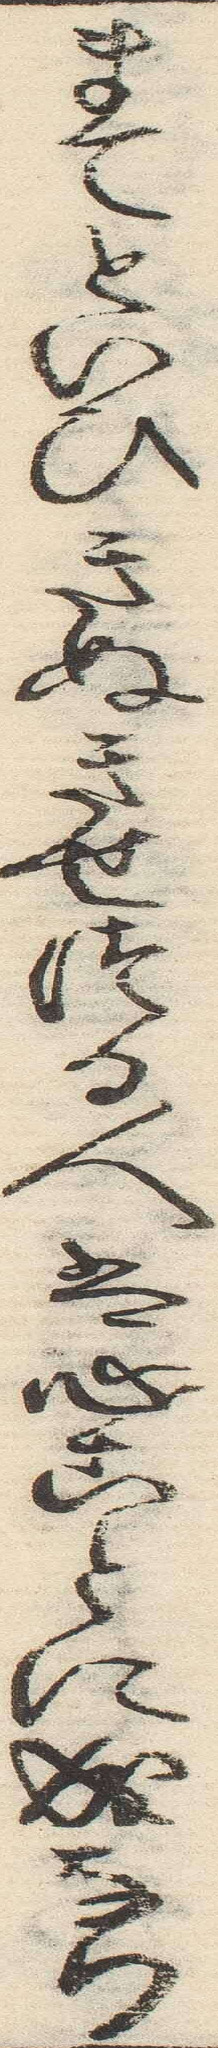まてといひきぬきせつるは心ことに成なり
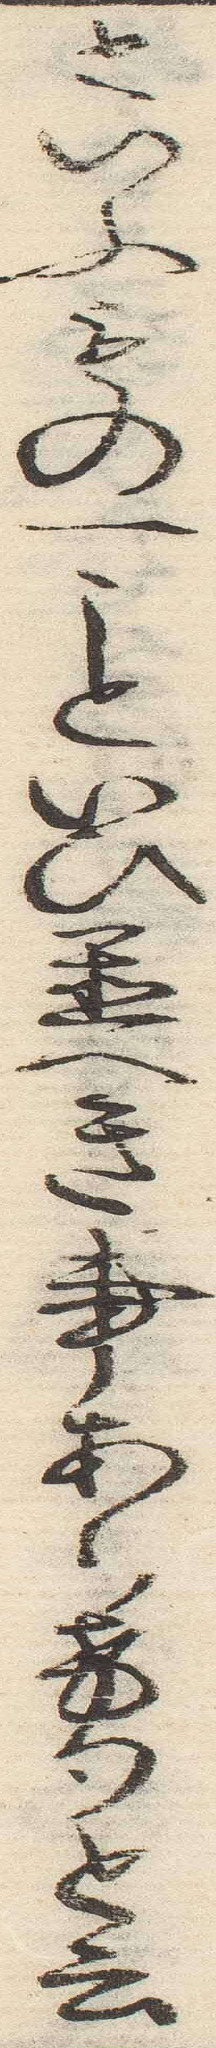といふもの一こといひ置へき事ありけりと云
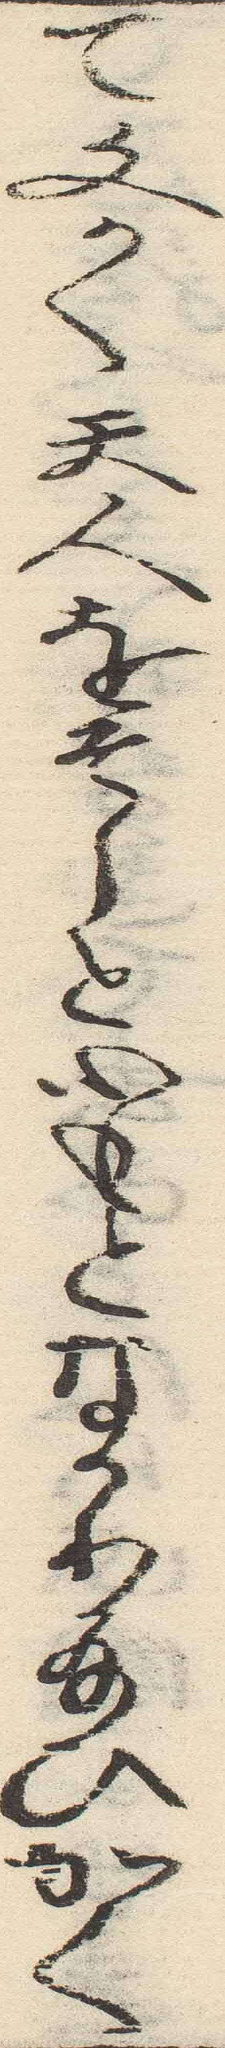て文かく天人をそしと心もとなかり給ひかく
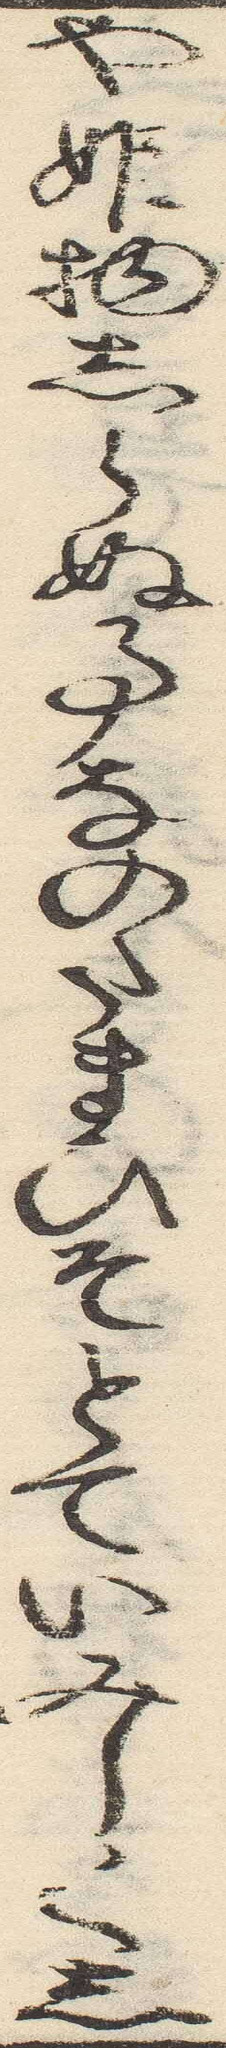や姫物しらぬ事なのたまひそとていみしくし
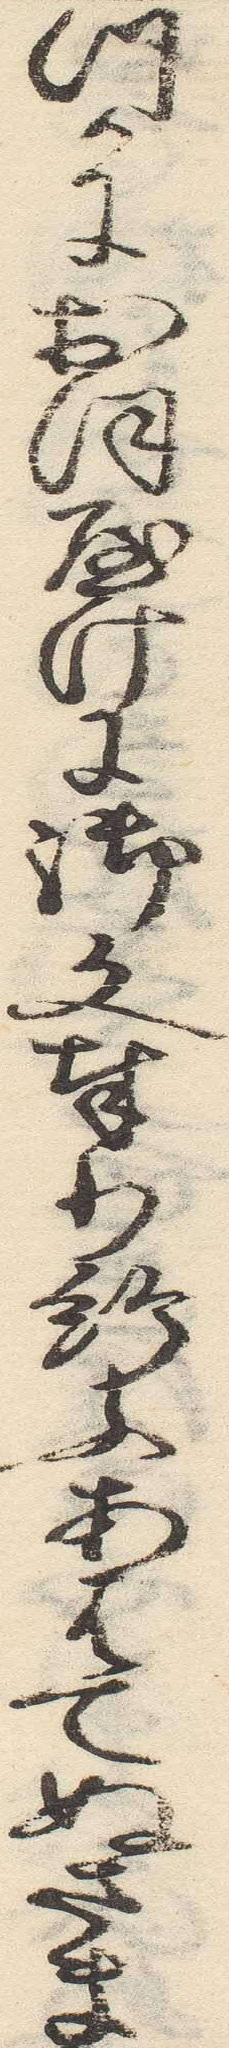つかにおほやけ御文奉り給ふあはてぬさま
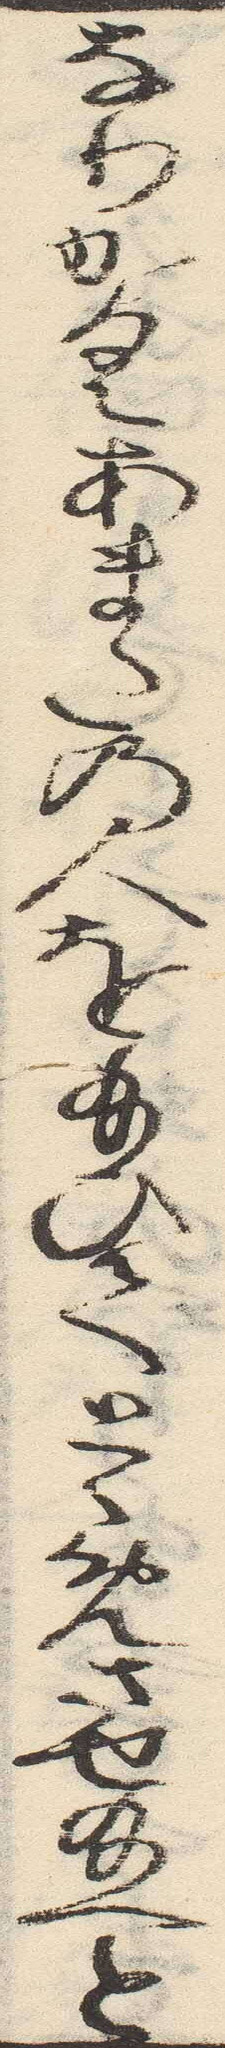なりかくあまたの人を給ひてとゝめさせ給へと
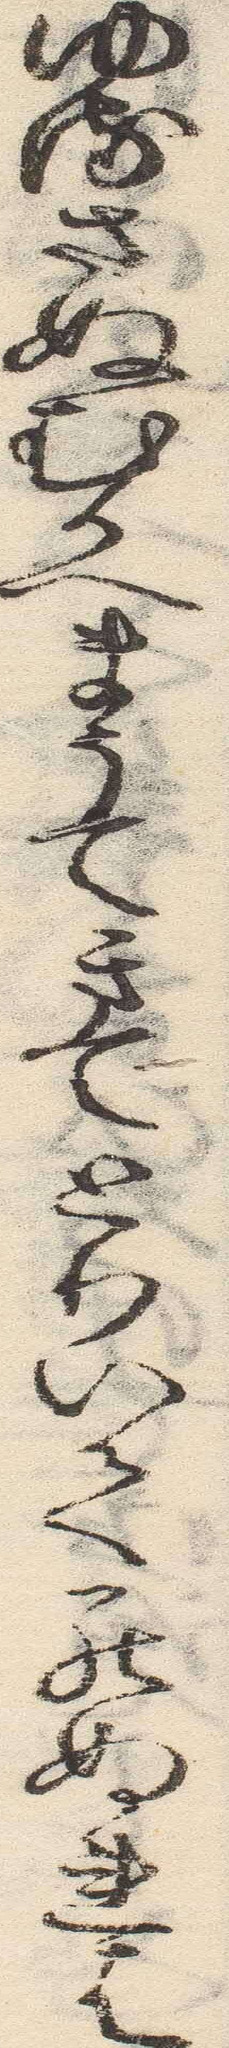ゆるさぬむかへまうてきてとりいて罷ぬれは
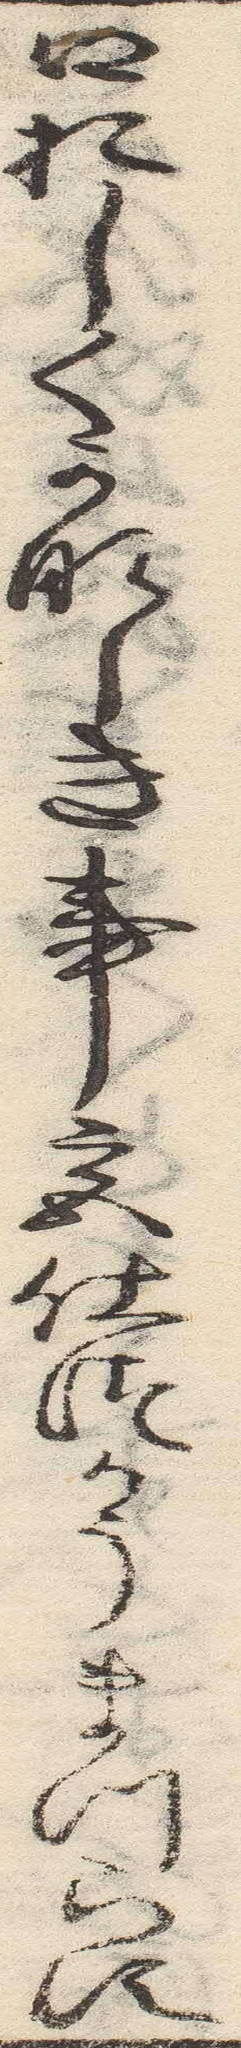口おしくかなしき事宮仕つかうまつらす
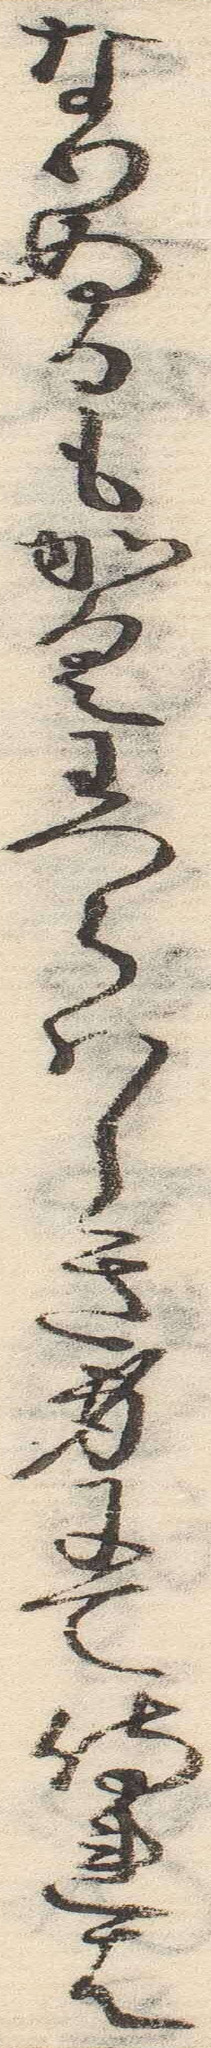なりぬるもかくわつらはしき身にて侍れは
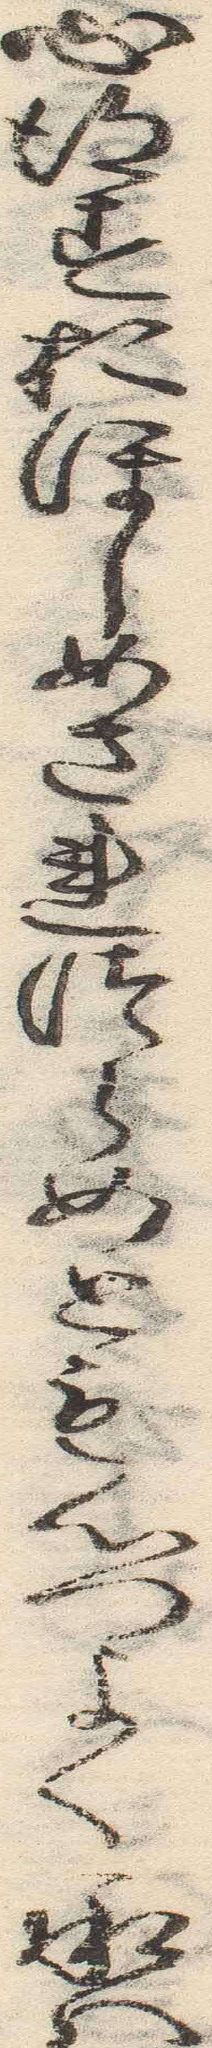心得すおほしめされつらめとも心つよく承は
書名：竹取物語
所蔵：東京学芸大学附属図書館 国文学研究資料館
